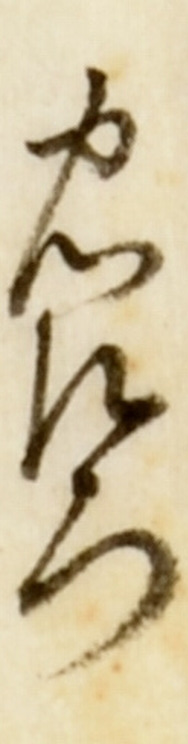孫左衛門
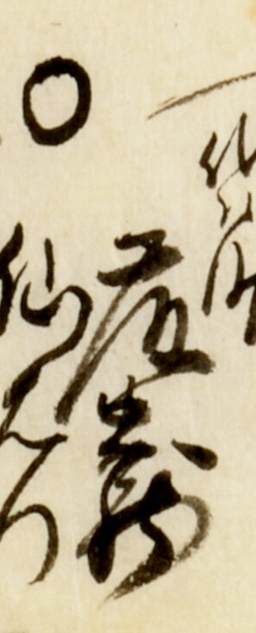十兵衛
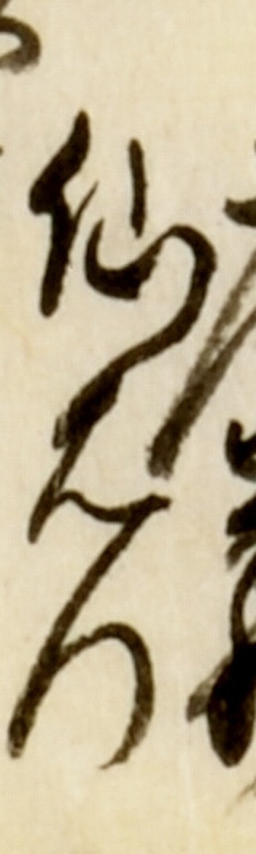傳右衛門
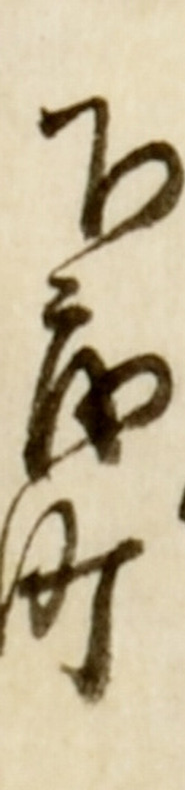下里町
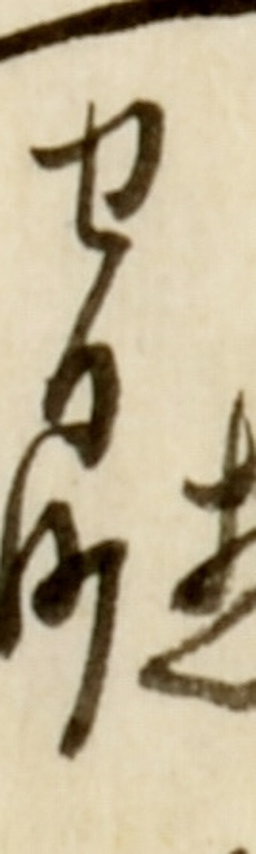せり町
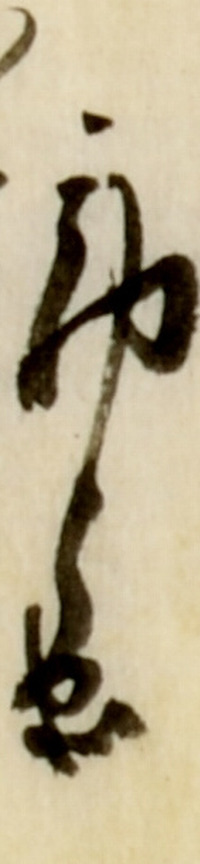十兵衛
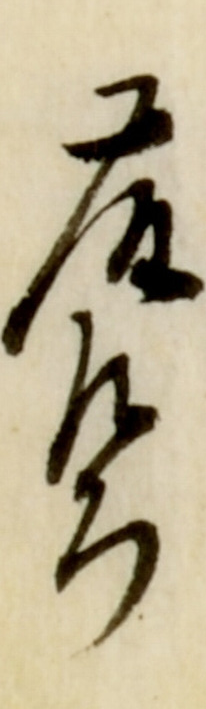藤左衛門

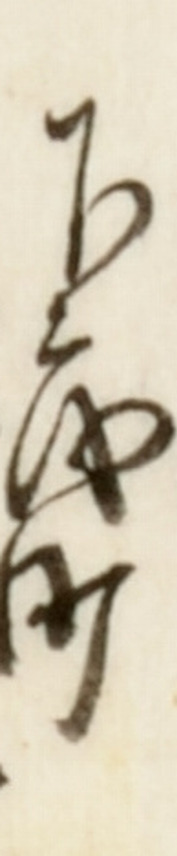下茂町
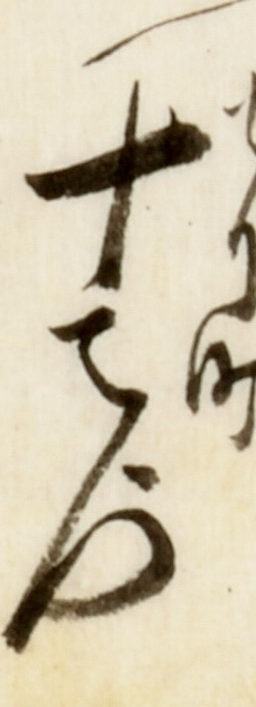十右衛門
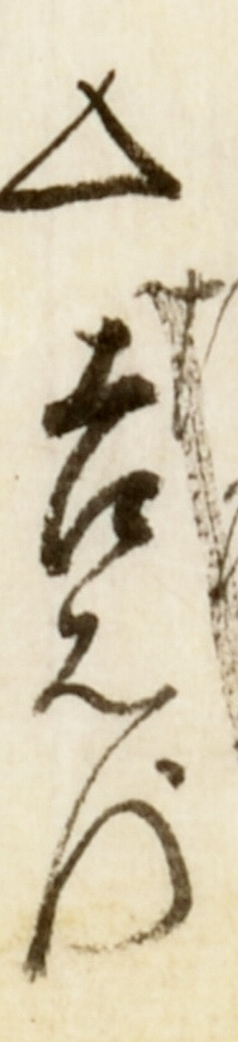徳右衛門
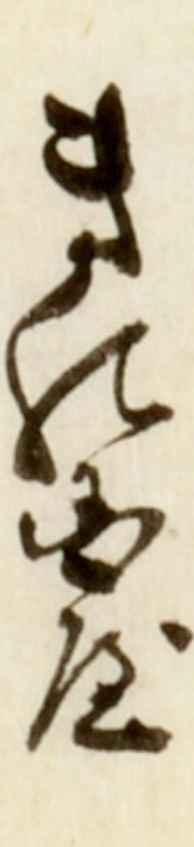きの国屋
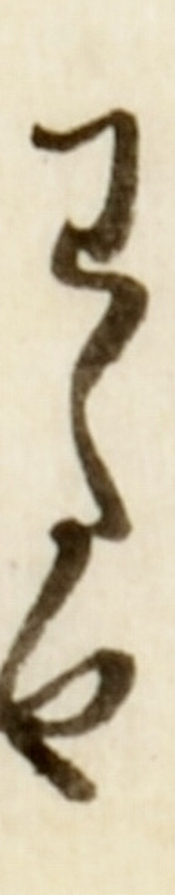わたや
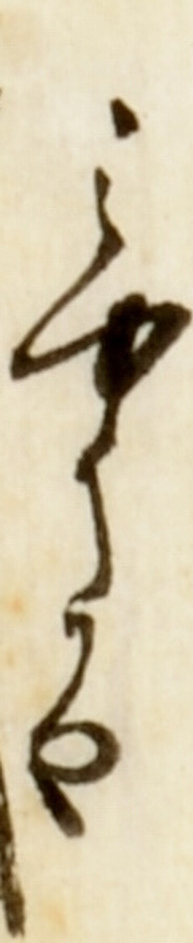みやうかや
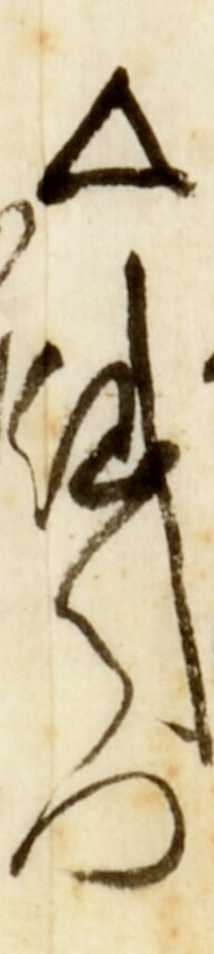徳右衛門
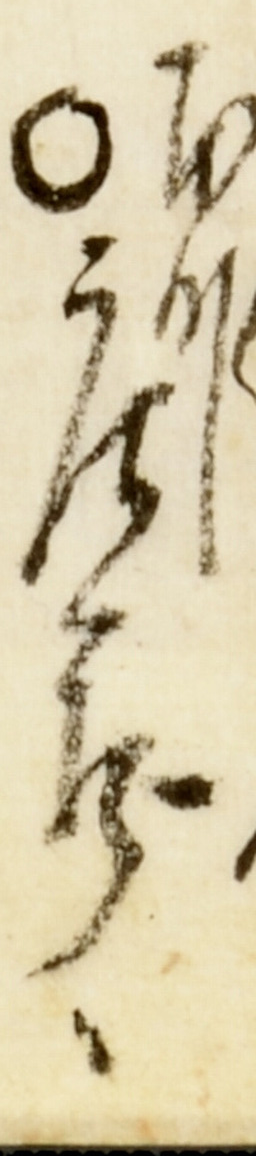○庄蔵
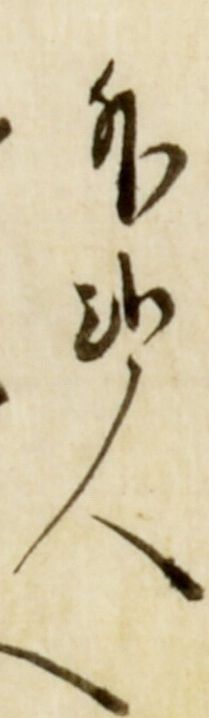外弐人
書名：役配人足割合帳
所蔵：伊那市立高遠町図書館・合同会社AMANE
